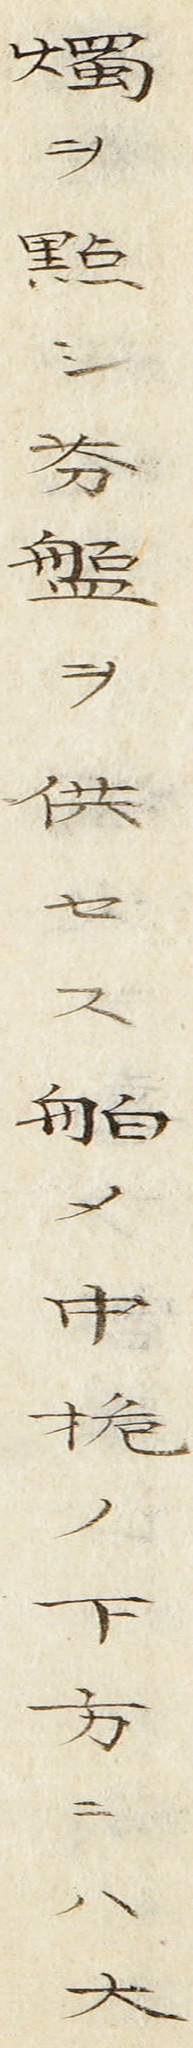燭ヲ点シ芬盤ヲ供セス舶シテ中桅ノ下方ニハ大
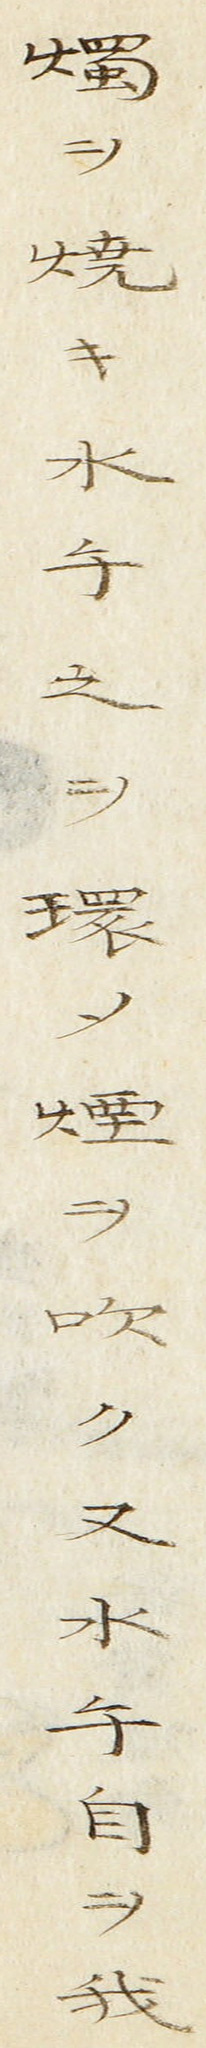燭ヲ焼キ水手之ヲ環シテ煙ヲ吹ク又水手自ヲ我
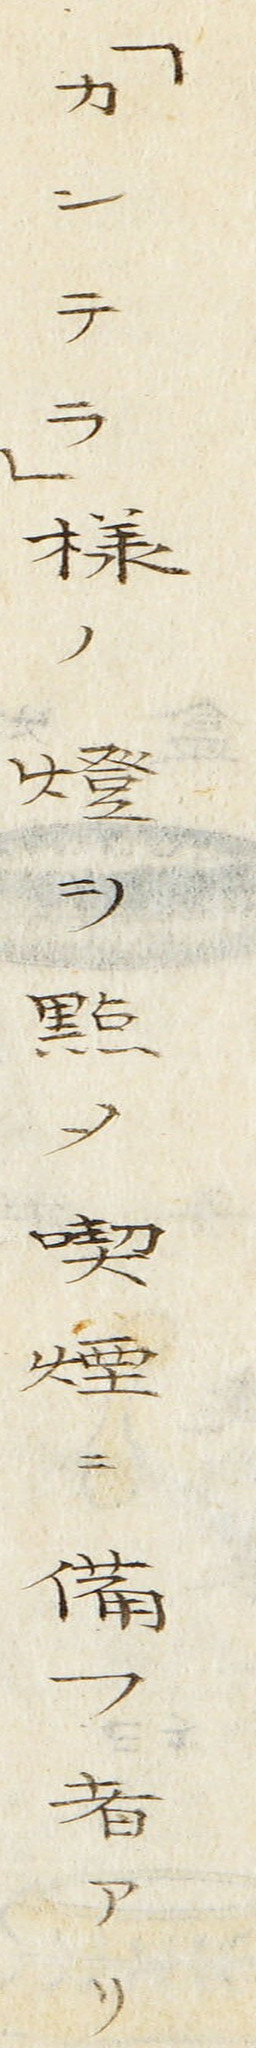「カンテラ」様ノ灯ヲ点シテ喫煙ニ備フ者アリ
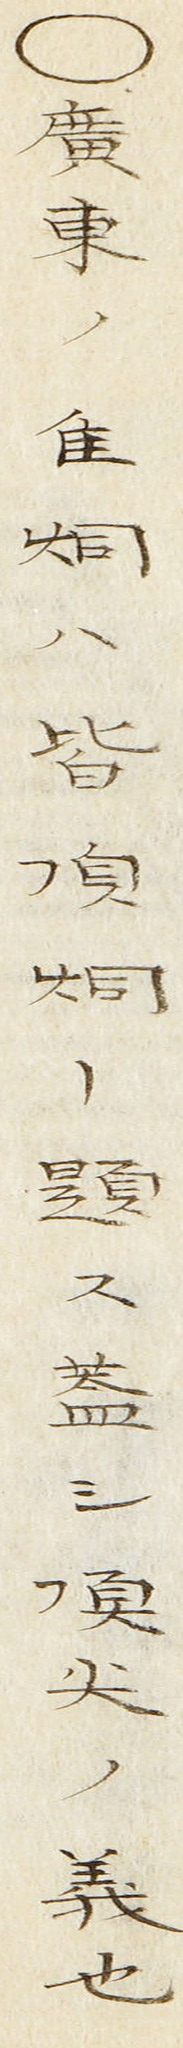〇広東ノ隹烟ハ皆頂烟ト？題シ蓋シ頂尖ノ義也
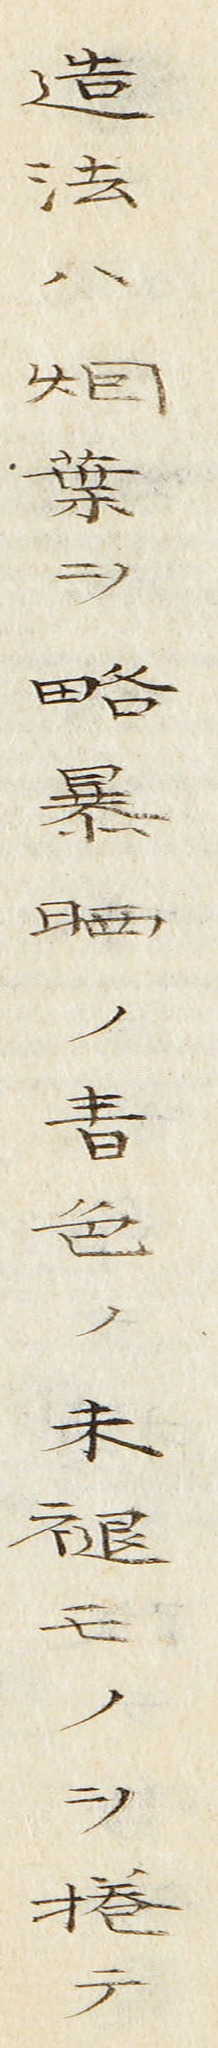造法ハ烟葉ヲ略暴晒ノ青色ノ未褪モノヲ捲テ
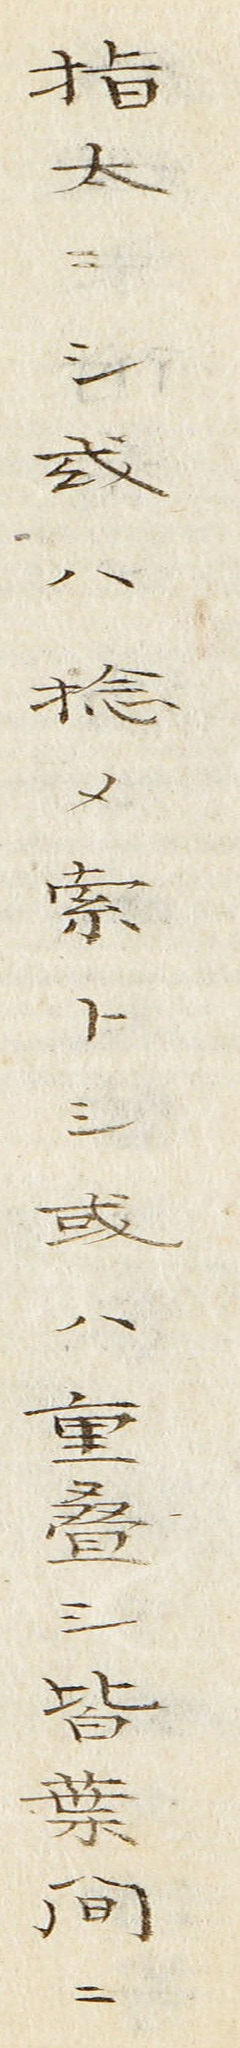指太ニシ或ハ捻シテ索トシ或ハ重畳シ皆葉間ニ
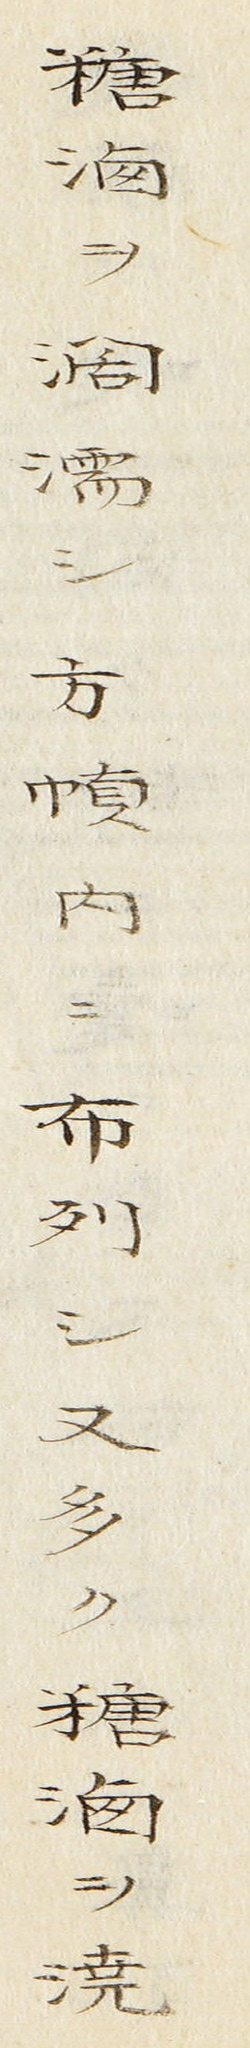糖滷？ヲ濶濡シ方幀内ニ布列シ又多ク糖滷？ヲ澆
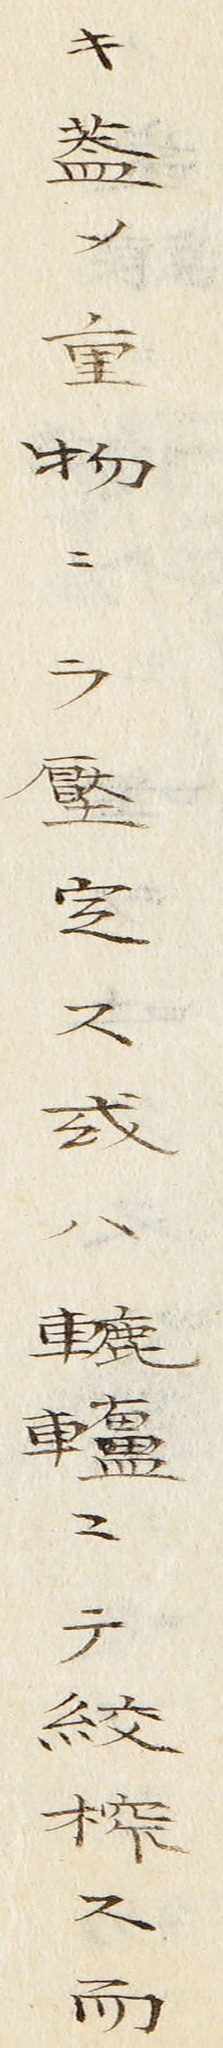キ蓋シテ重物ニテ？圧定ス或ハ轆轤ニテ絞搾ス而
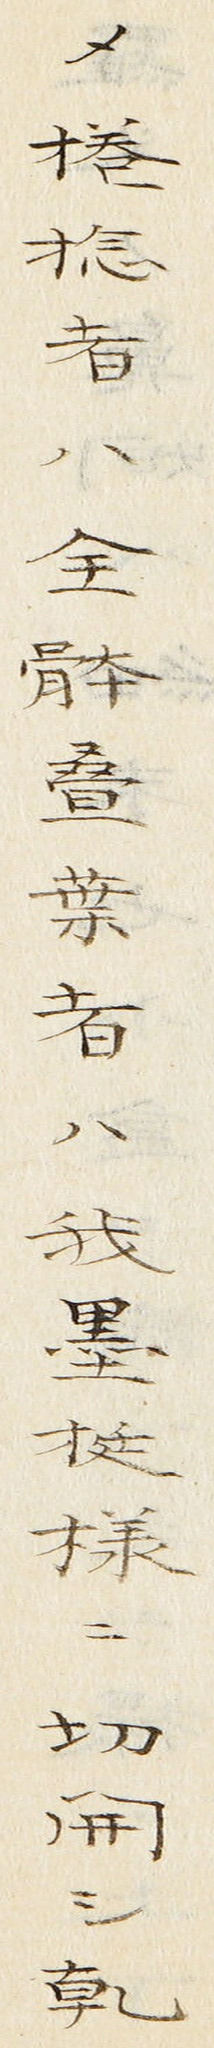シテ捲捻者ハ全体畳葉者ハ我墨挺様ニ切開シ乾
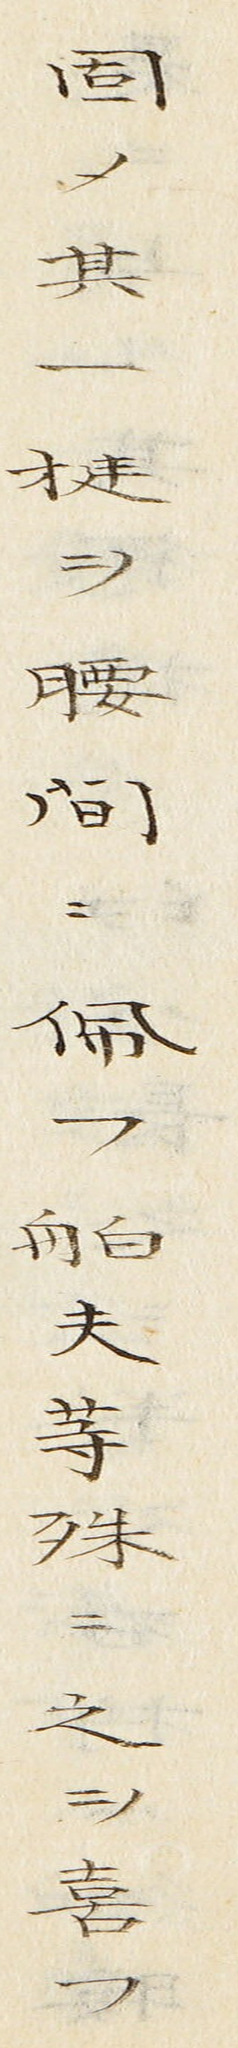固シテ其一挺ヲ腰間ニ佩フ舶夫等殊ニ之ヲ喜フ
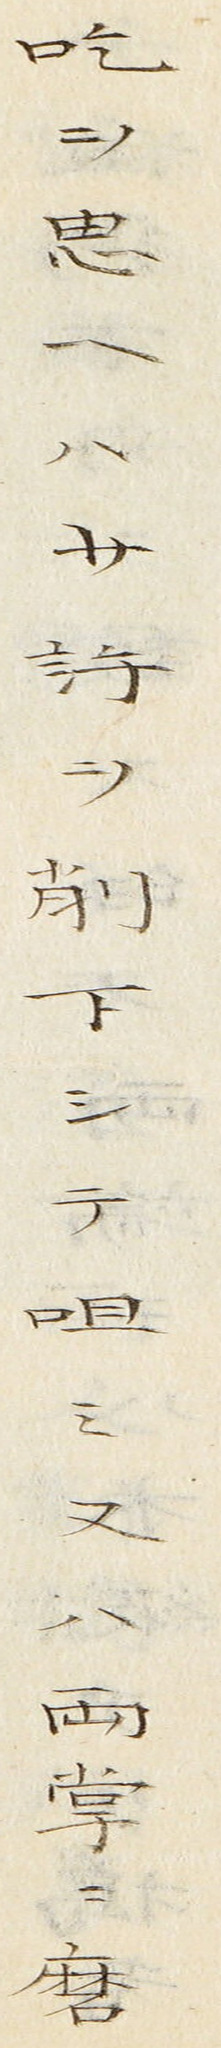吃ヲ思ヘハ少許ヲ削下シテ咀ミ又ハ両掌ニ磨
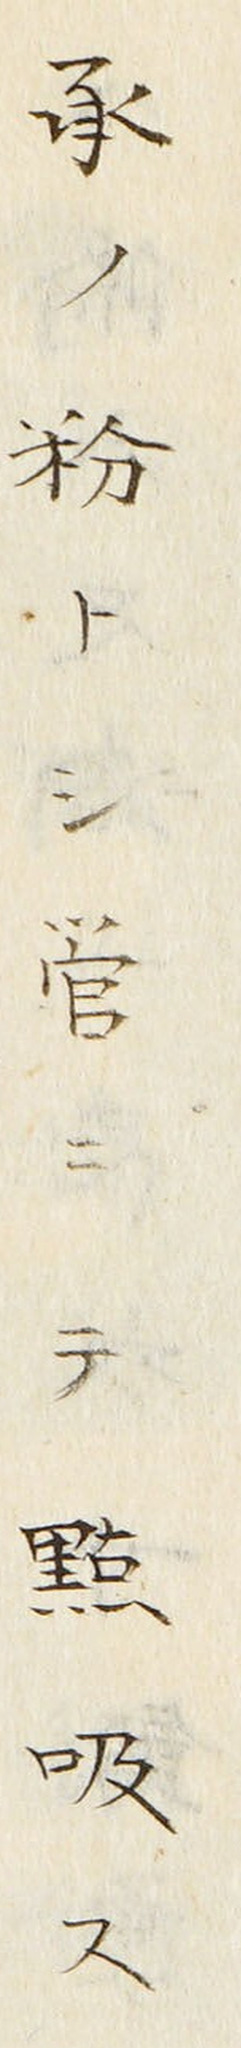承ノ粉トシ管？ニテ点吸ス
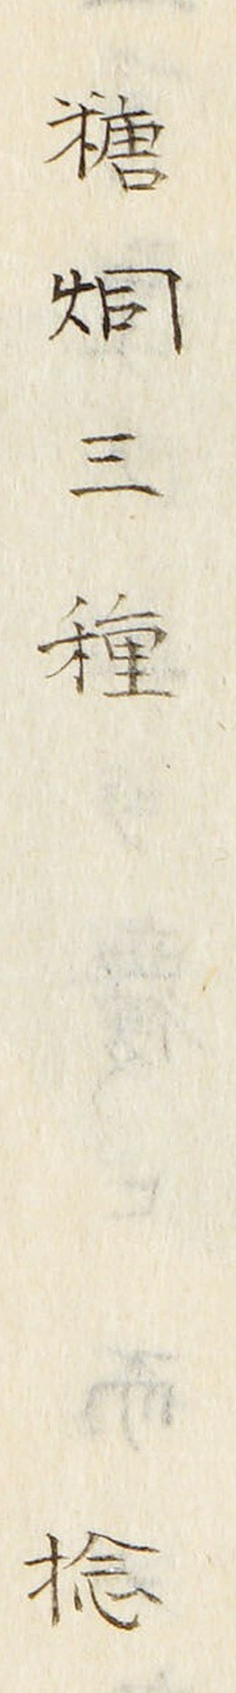糖烟三種捻
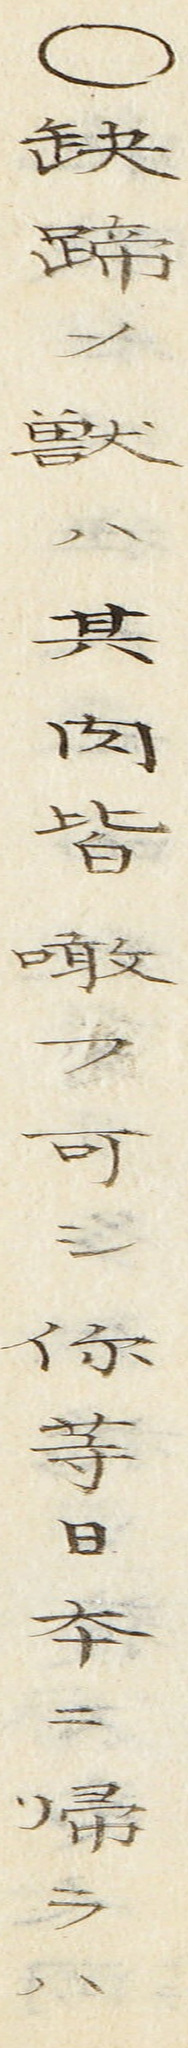〇欠蹄シテ獣ハ其肉皆噉フ可シ你等日本ニ帰らラハ

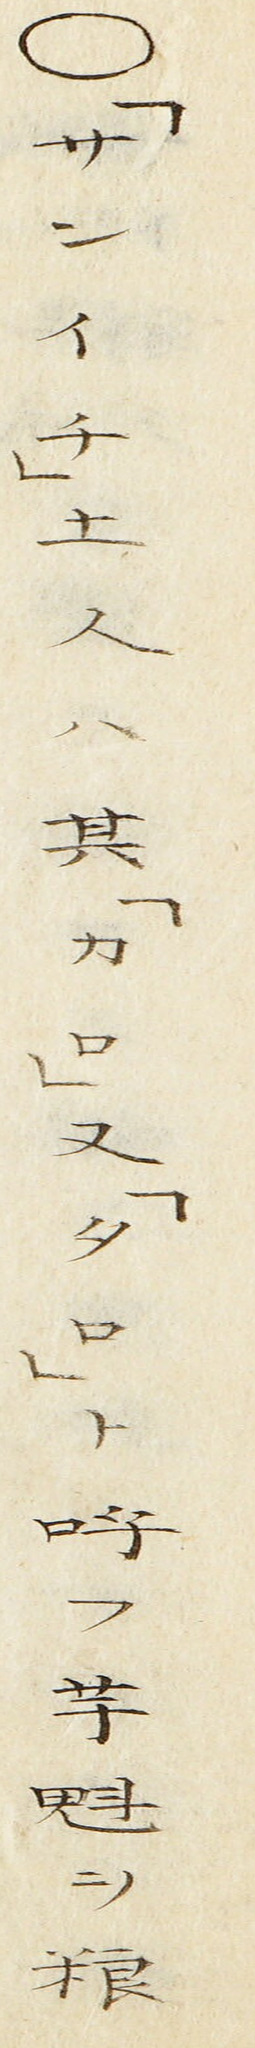〇「サンイチ」土人ハ其「カロ」又「タロ」ト呼フ芋魁ヲ粮
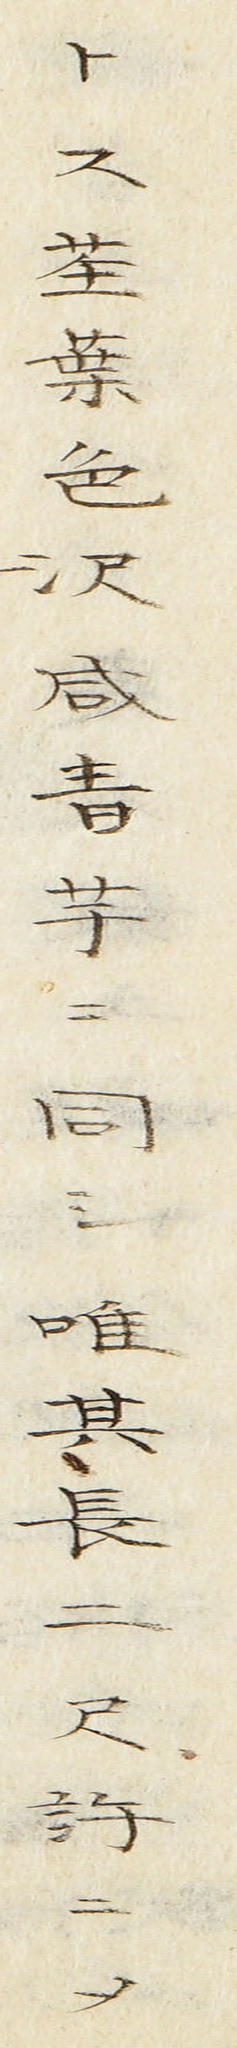トス茎葉色沢咸青芋ニ同シ唯其長二尺許にニシテ
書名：蕃談
